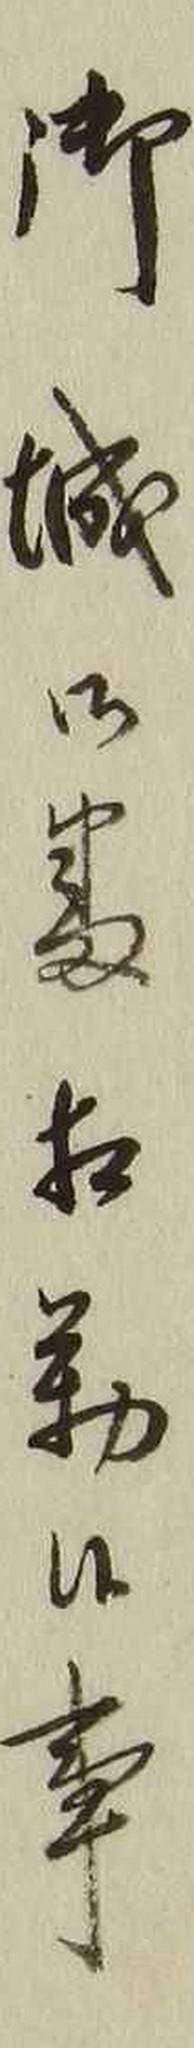御城御番相勤候事
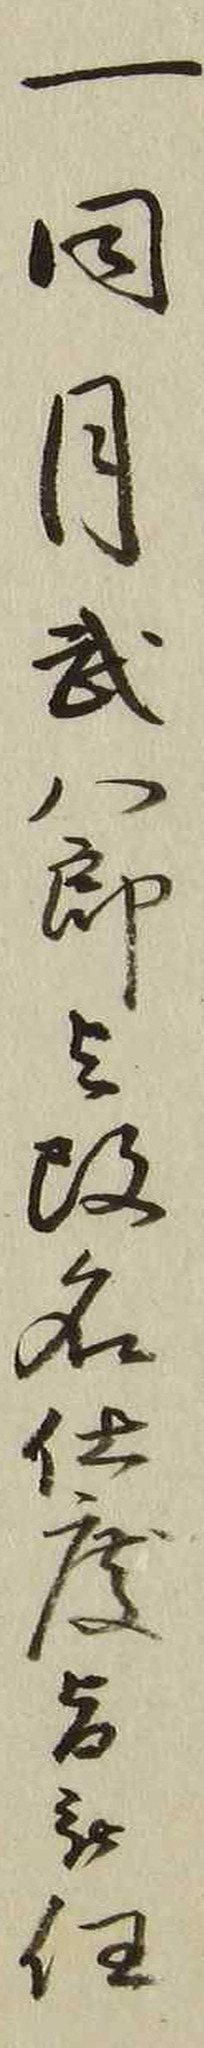一同月武郎八与改名仕度旨被任
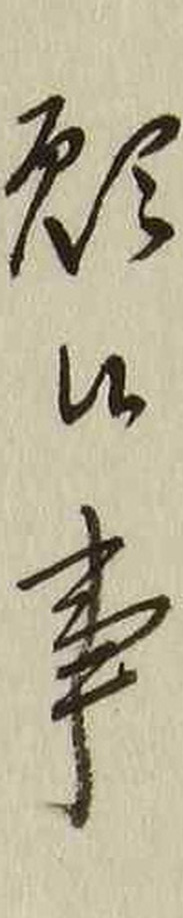願候事
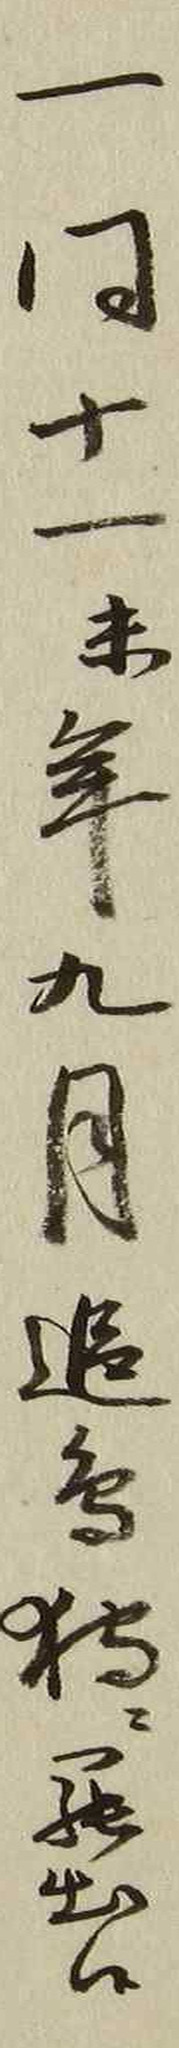一同十一未年九月追鳥狩ニ罷出候
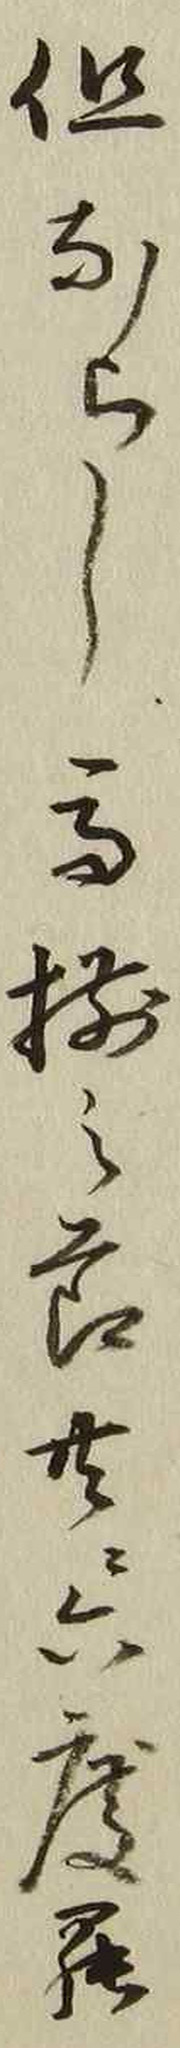但ならし馬揃之節共ニ六度罷
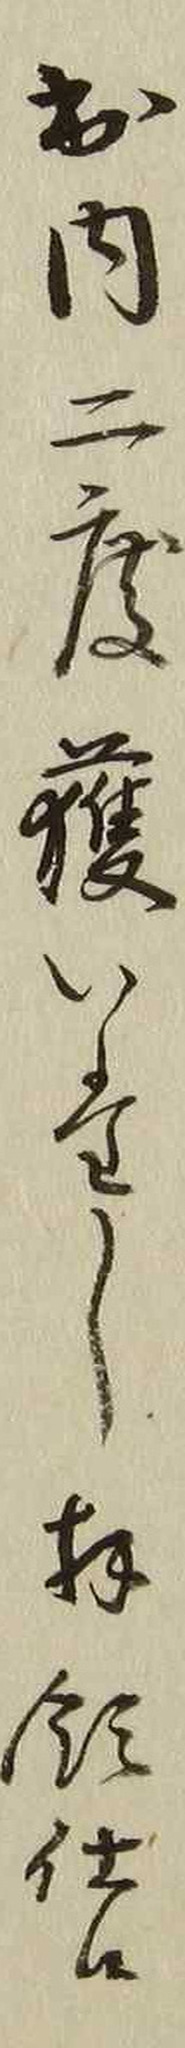出内二度獲いたし拝領仕候
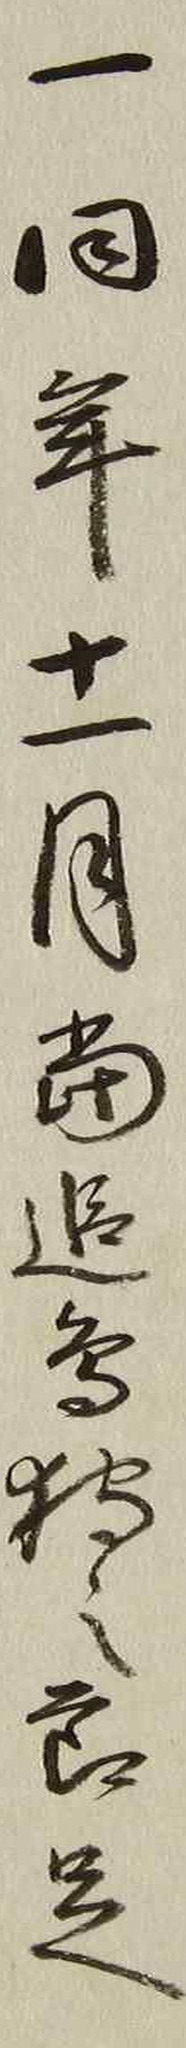一同年十一月当追鳥狩之節足
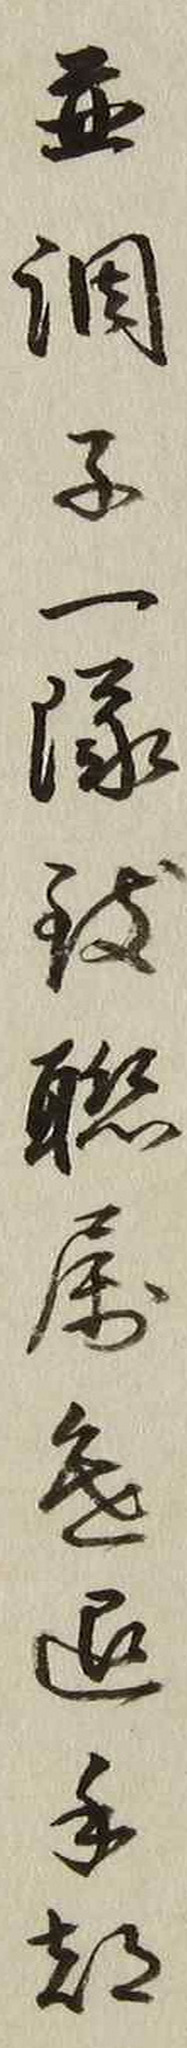並調子一隊致聯属進退手都
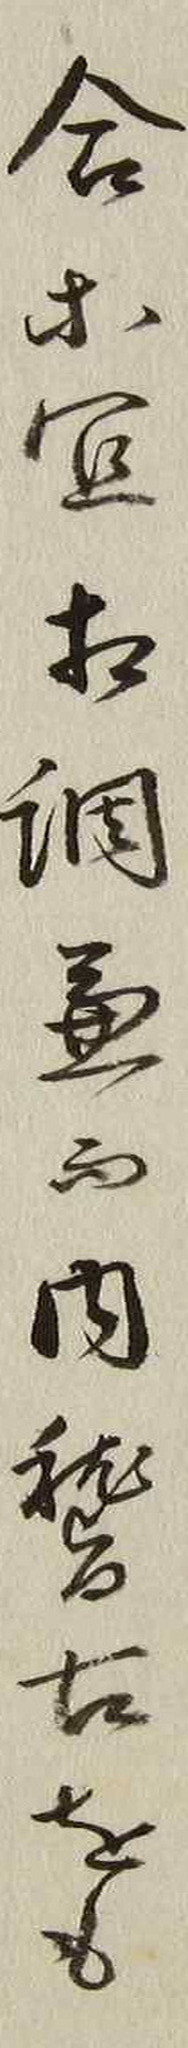合等宜相調兼而内稽古をも
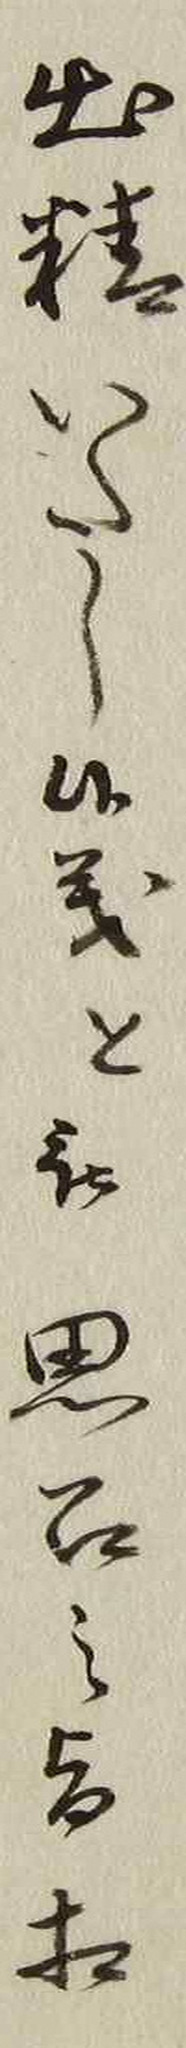出精いたし候義と被思召之旨相
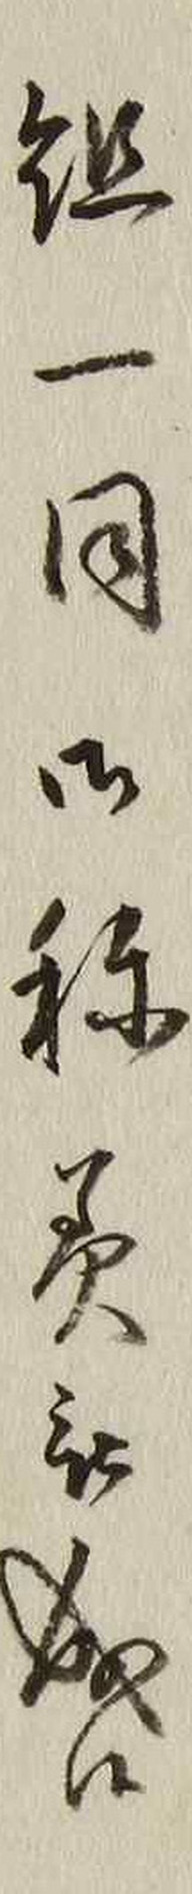組一同御称美被成候
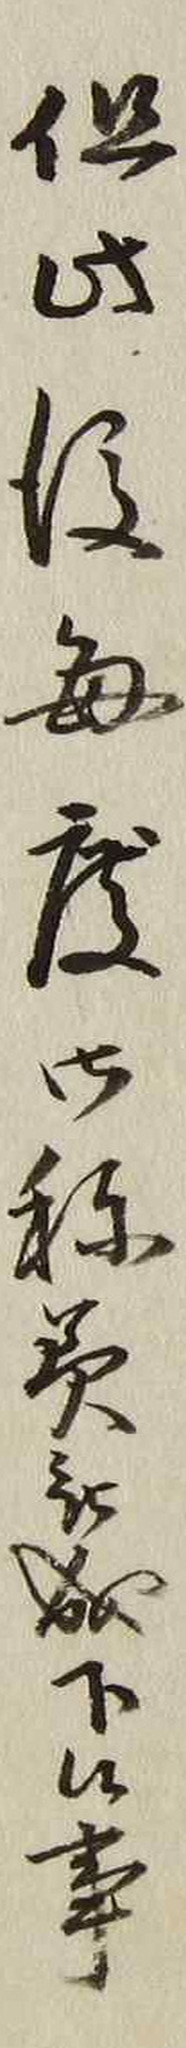但此後毎度御称美被成下候事
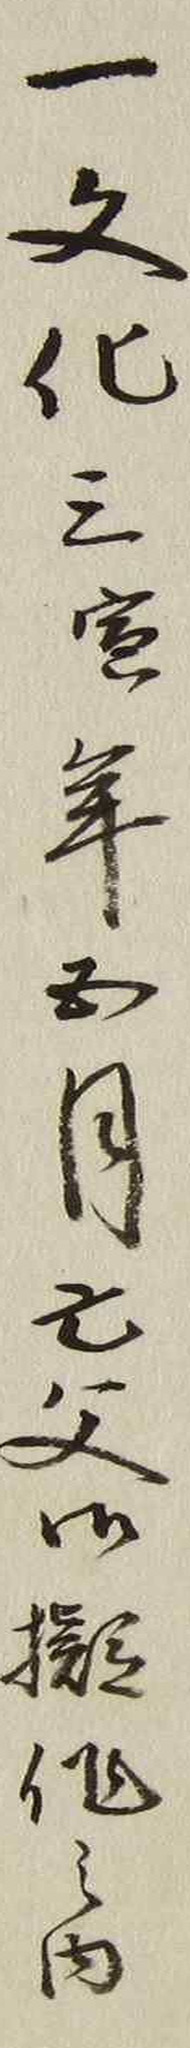一文化三寅年五月亡父御擬作之内
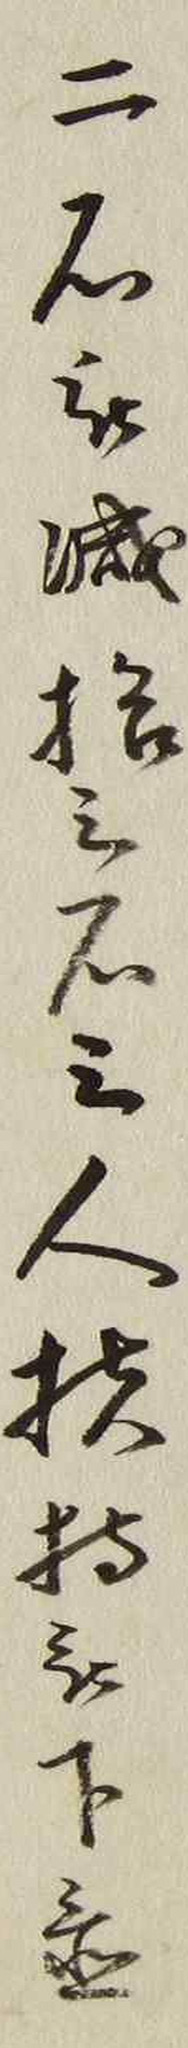二石被減拾三石三人扶持被下置
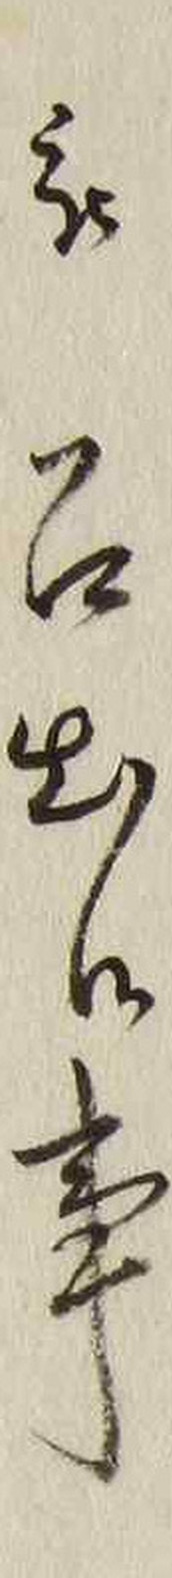被召出候事
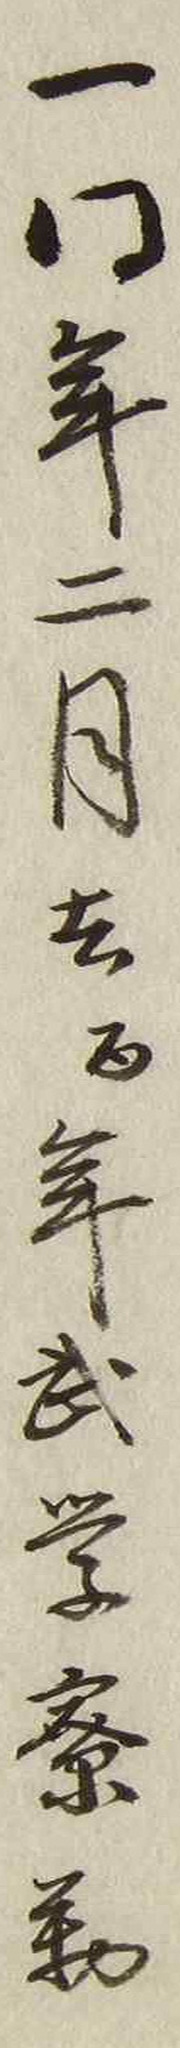一同年二月去酉年武学寮勤
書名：諸士系譜　巻之149　そ之部2
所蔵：会津若松市立会津図書館
